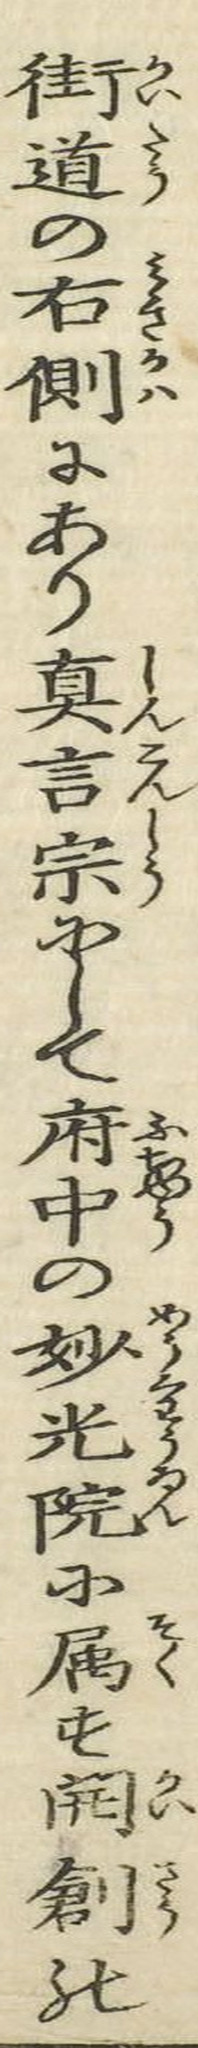街道の右側にあり真言宗にして府中の妙光院に属す開創の
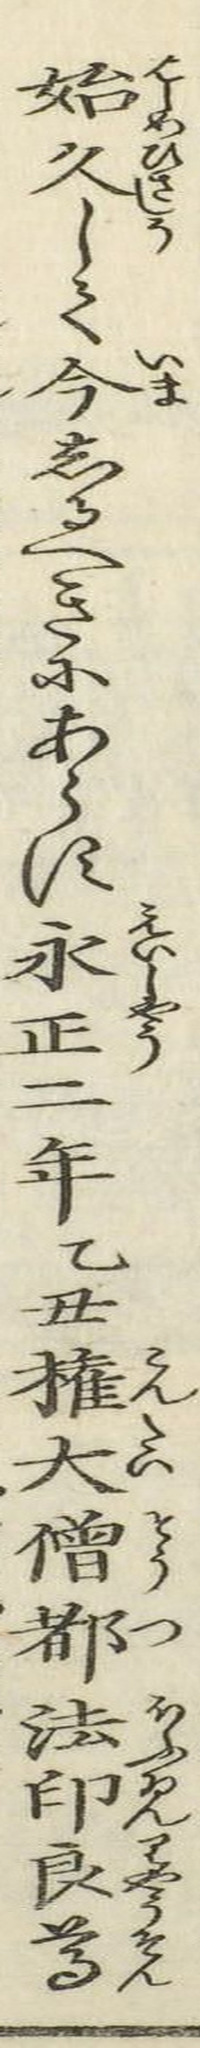始久して今しるへきにあらす永正二年乙丑権大僧都法印良尊
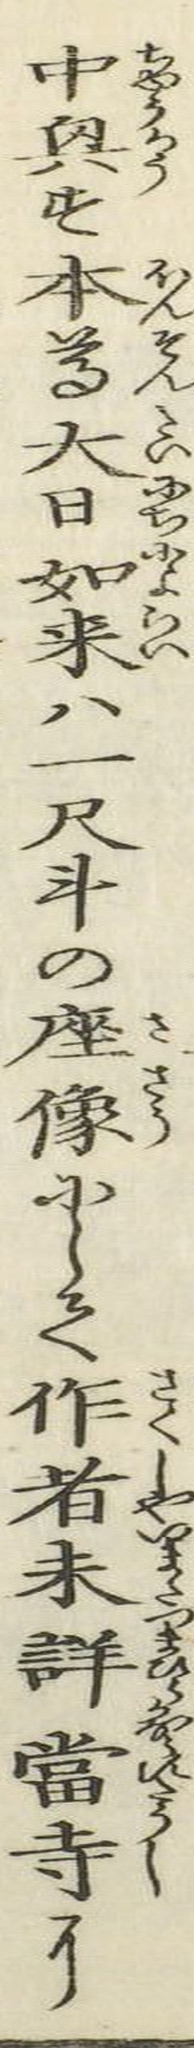中興す本尊大日如来は一尺斗の座像にして作者未詳当寺に
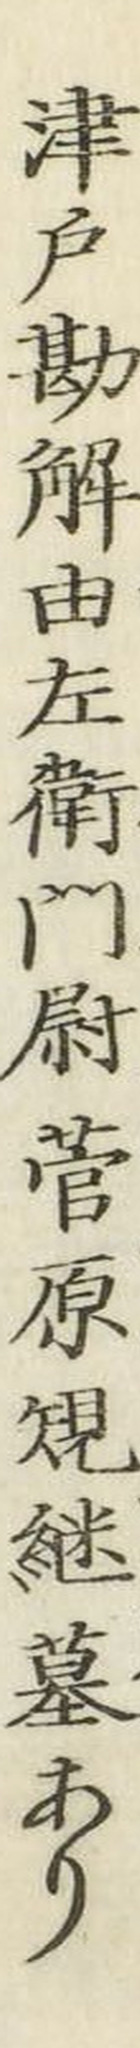津戸勘解由左衛門尉菅原規継墓あり
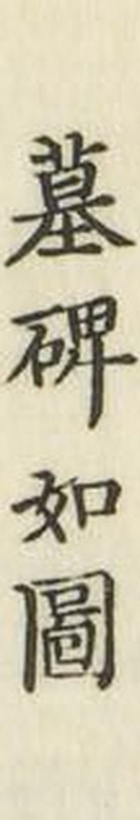墓碑如図
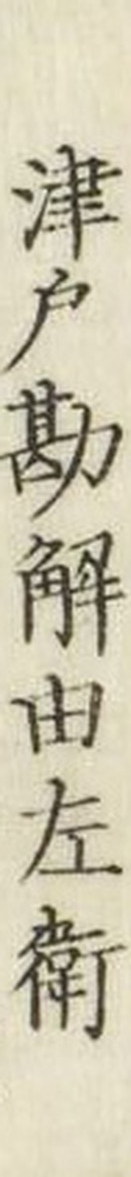津戸勘解由左衛
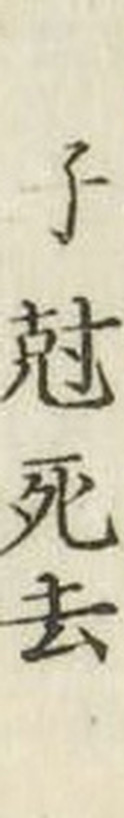子尅死去
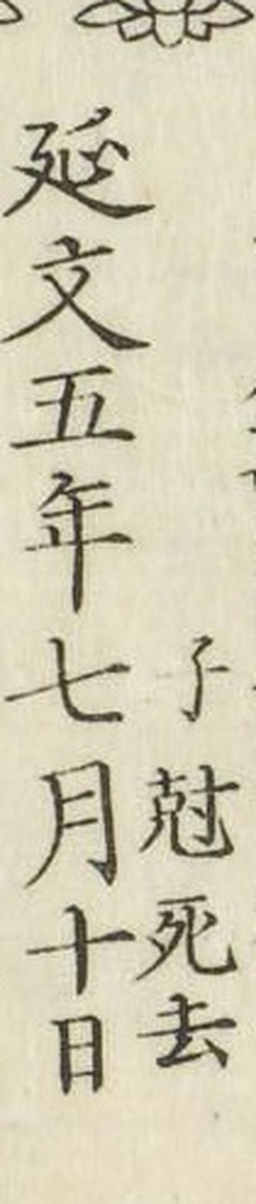延文五年七月十日
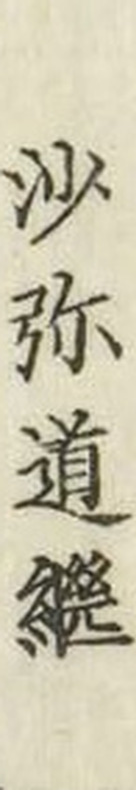沙弥道継
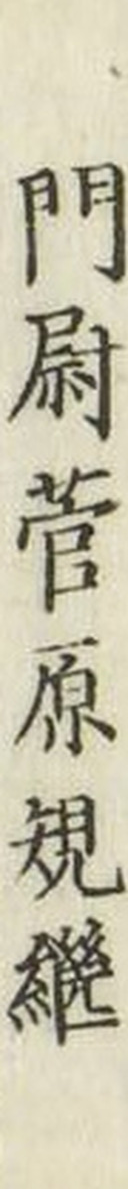門尉菅原規継
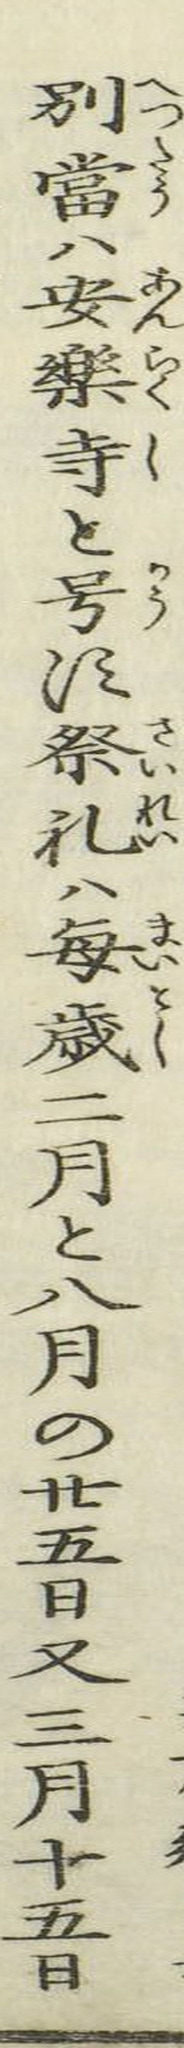別当は安楽寺と号す祭礼は毎歳二月と八月の廿五日又三月十五日
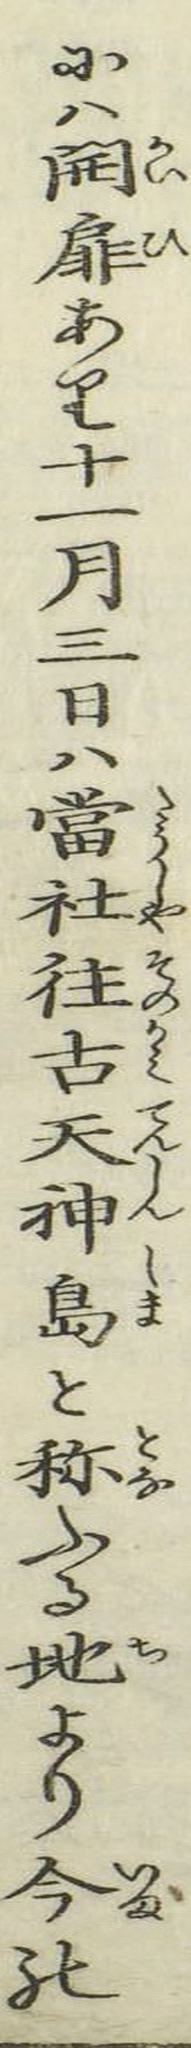には開扉あり十一月三日は当社往古天神島と称ふる地より今の
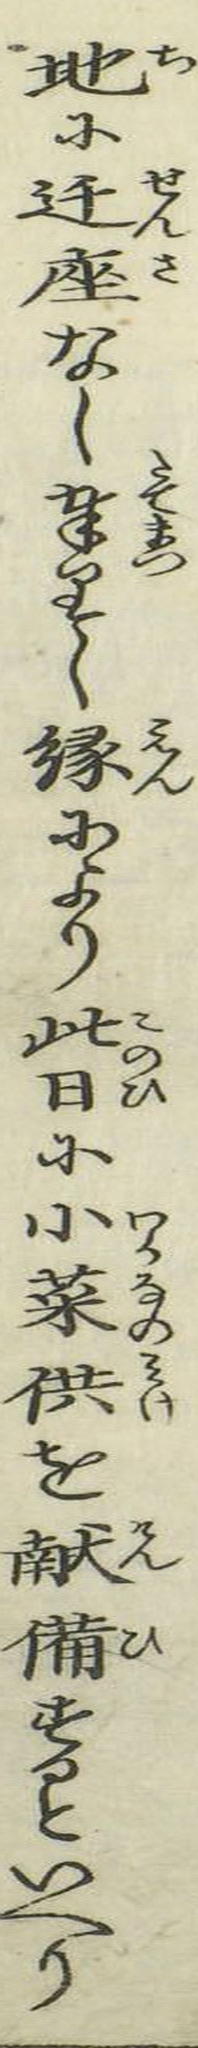地に遷座なし奉りし縁により此日に小菜供を献備するといへり
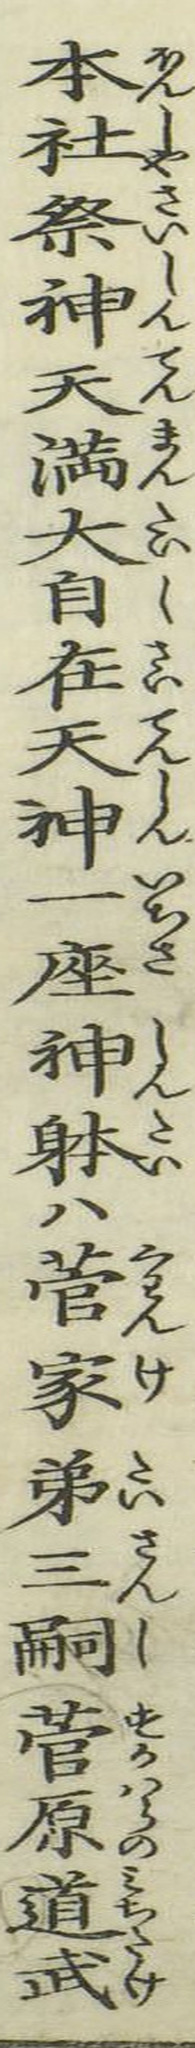本社祭神天満大自在天神一座神躰は菅家弟三嗣菅原道武

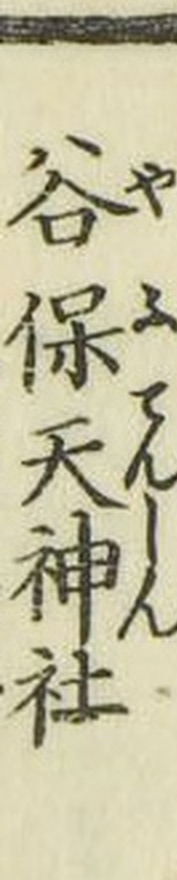谷保天神社
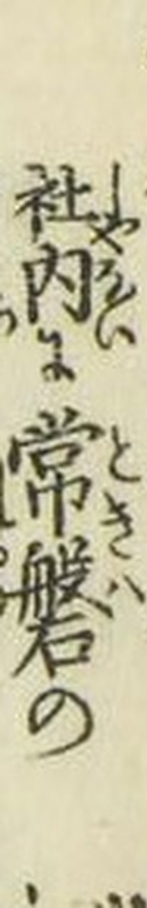社内に常磐の
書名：江戸名所図会 20巻 巻之10
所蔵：東京学芸大学教育コンテンツアーカイブ
